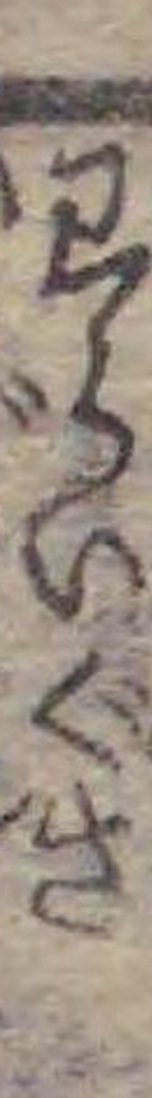わらいぐさ
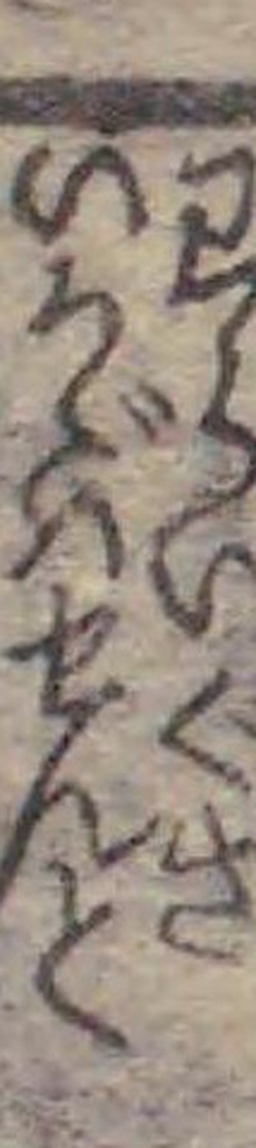いかゞはせんと
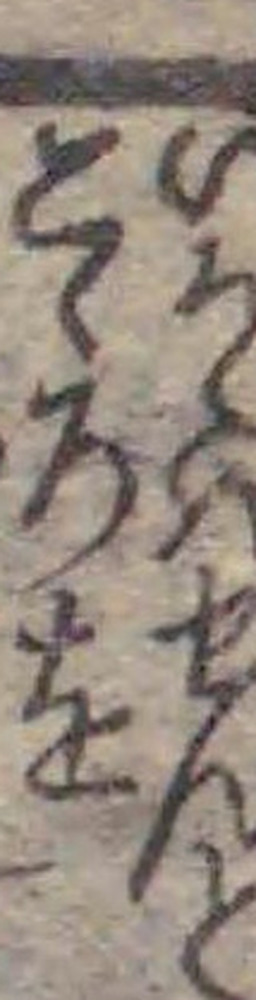こゝろを
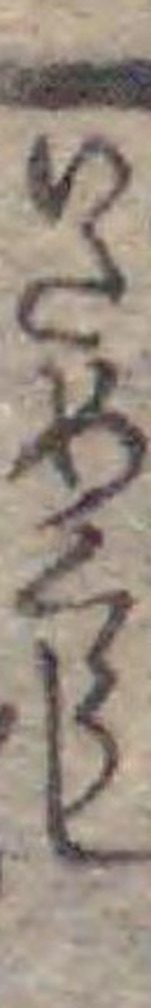いためくらし
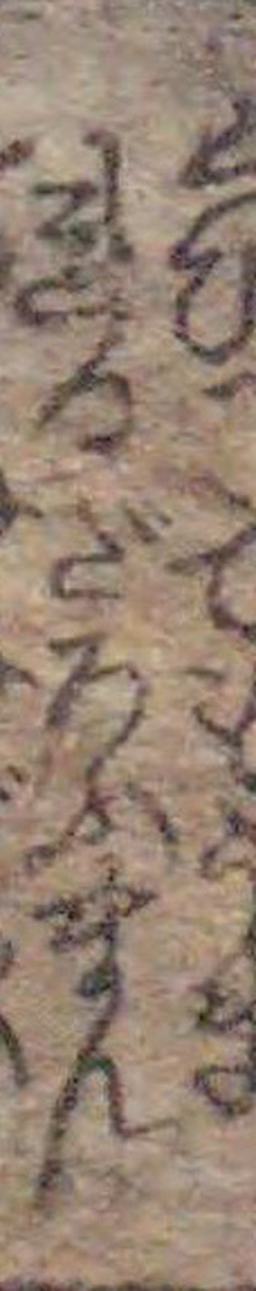れるだろふまん
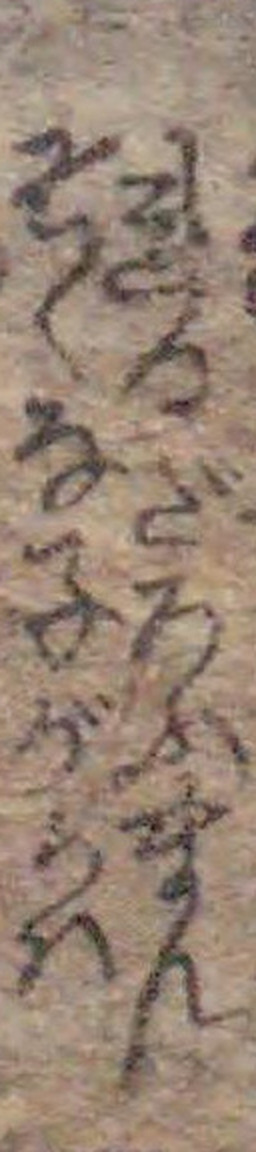そくな子がかは
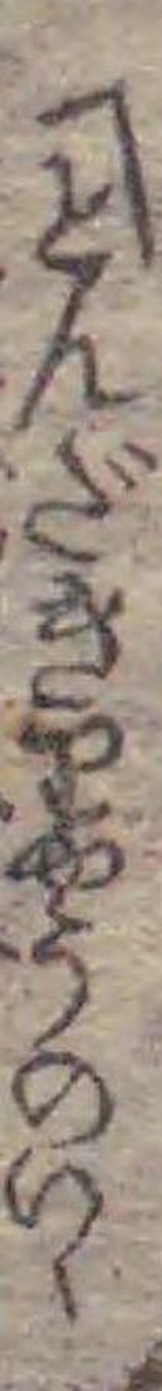〽とんだきやうのいゝ
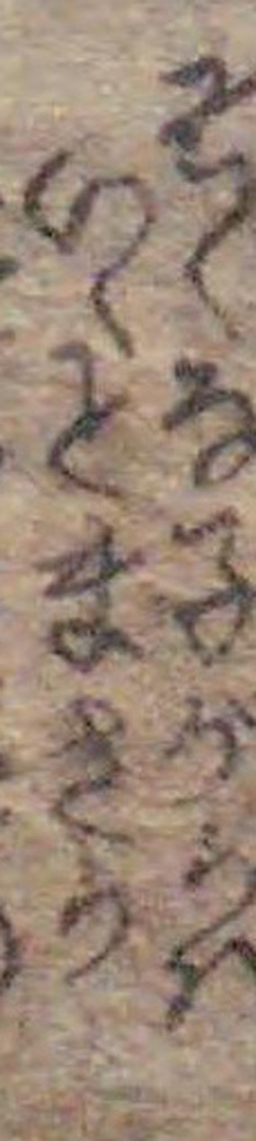いゝとまさか
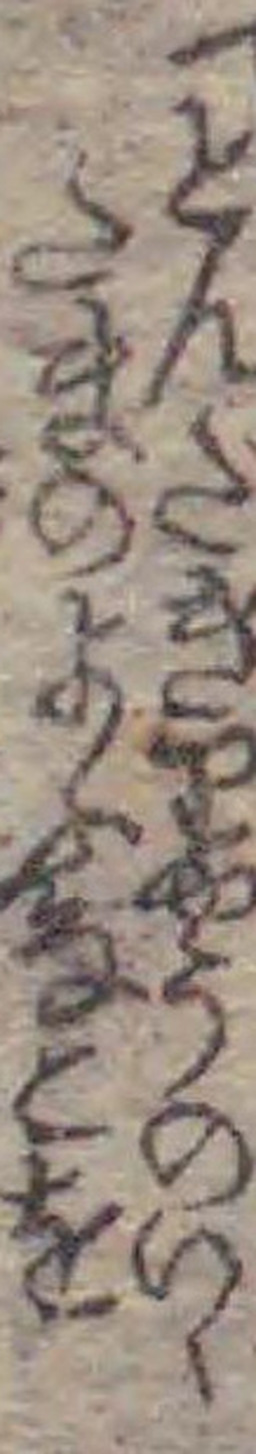たまのよふなこを
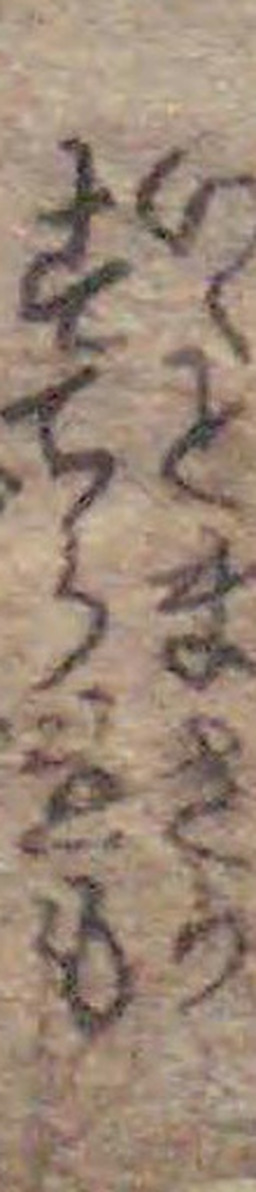すてられも
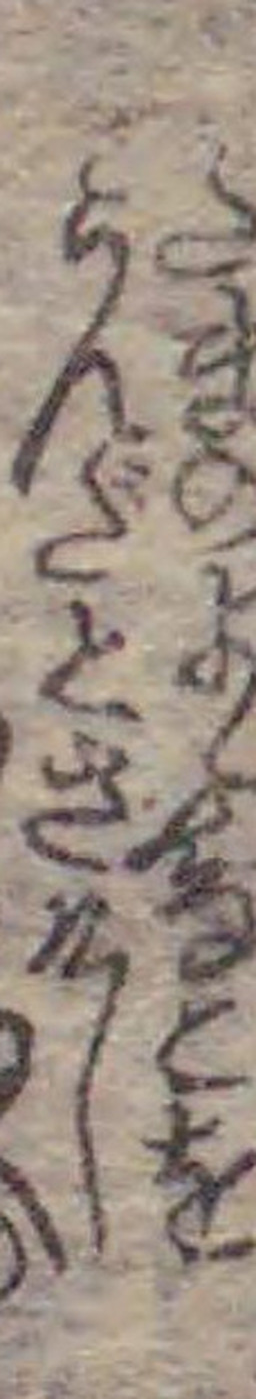うんだとさけし
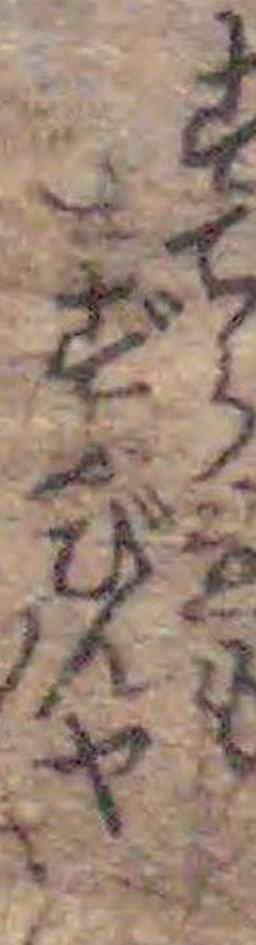せずふびんや
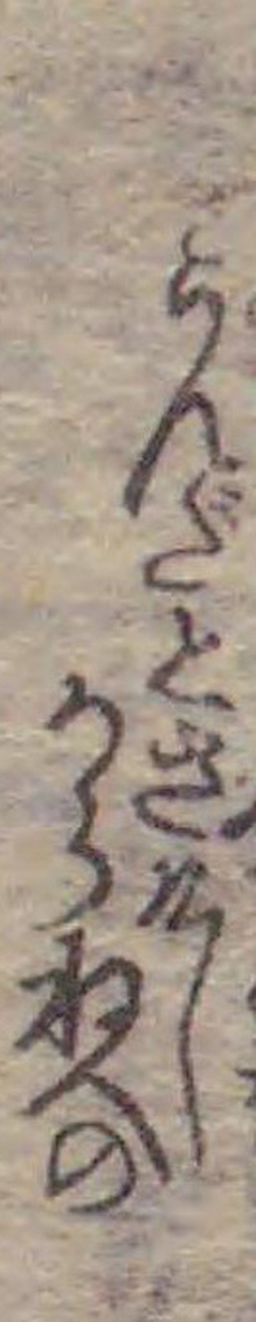からねへの
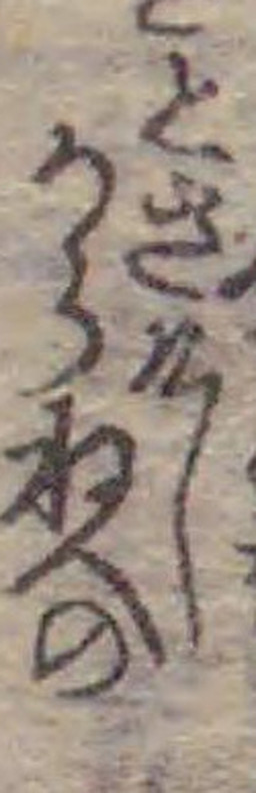からねへの
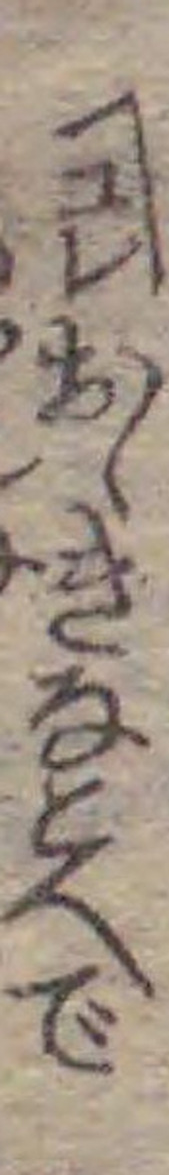〽コレおゝきなこへで
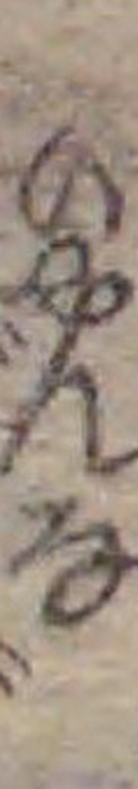いやんな
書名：化物見越松 : 2巻
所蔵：国立国会図書館 National Diet Library, JAPAN
